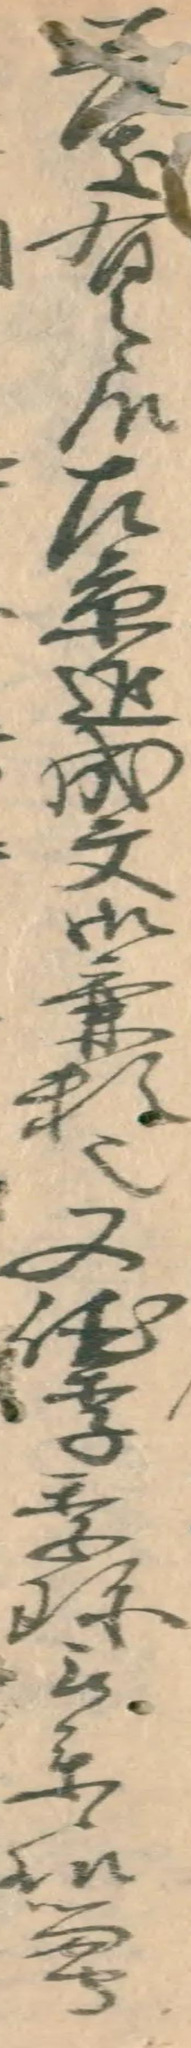差支有之候故左京進成文御兼頼也又徳季季珎被参候処留守
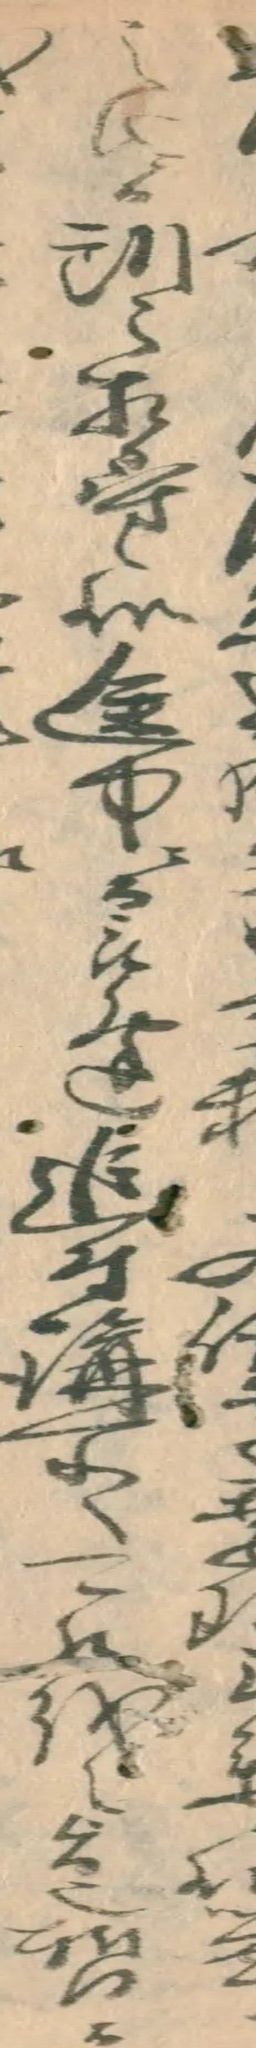之由ニ而所々相尋候処途中ニ而被逢追付講所へ可罷越候旨也暫而
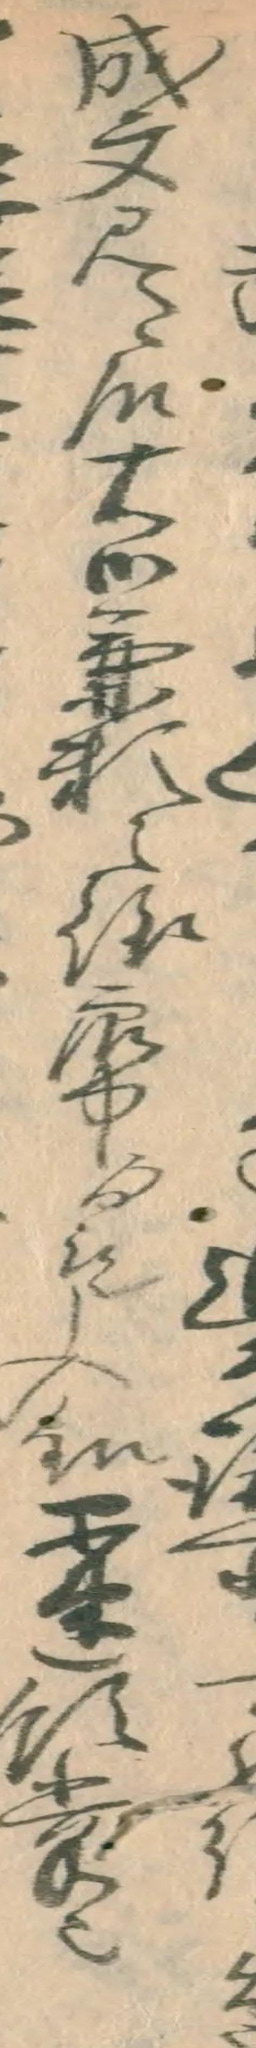成文見へ候故右御兼頼之趣衆中ゟ被申入候処早速領掌也
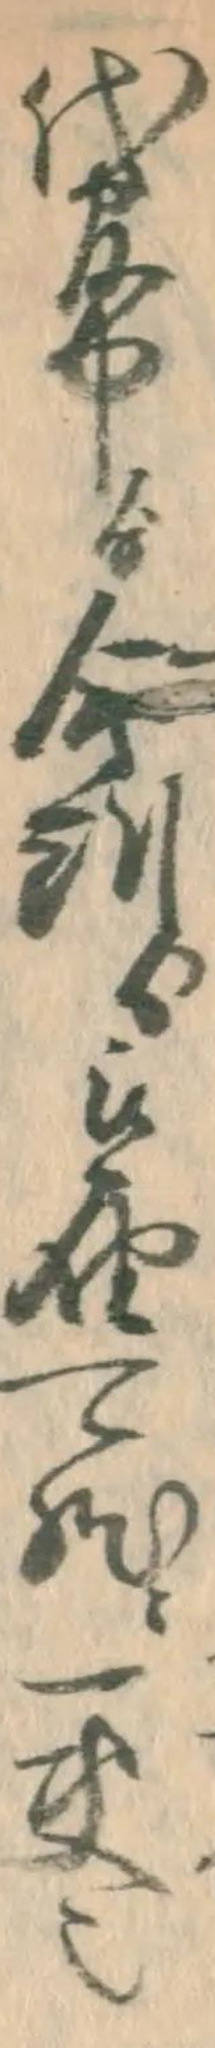代官中ゟ会所ゟ被届可然ニ一決也
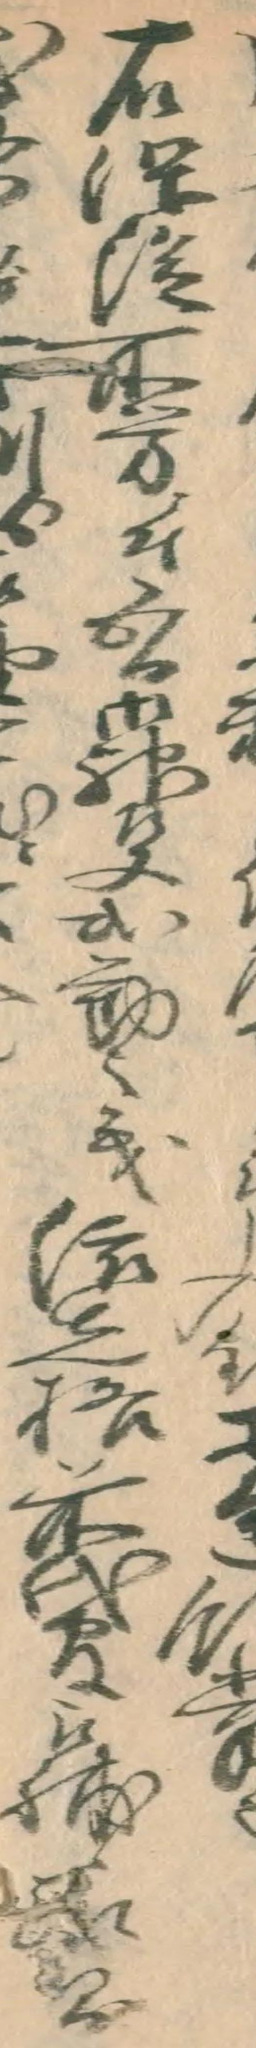右保従所労ニ付五日御神事出勤之義依先格前代官被補候様
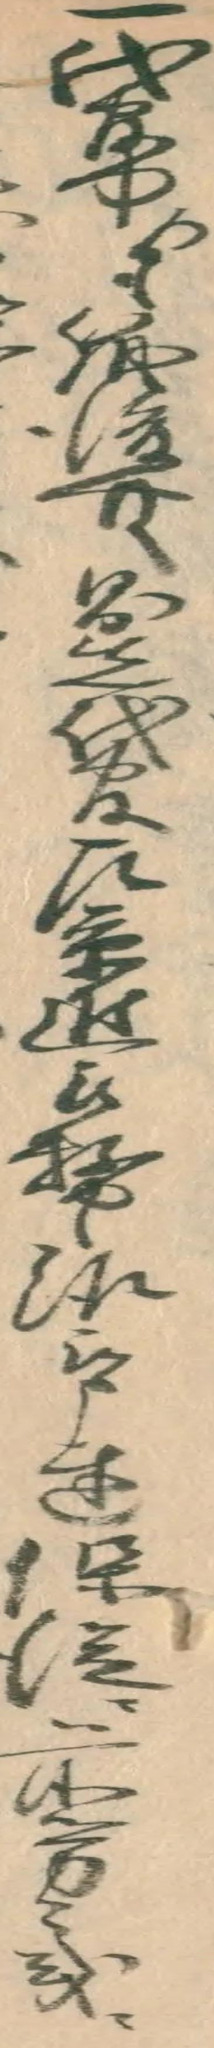一代官中ゟも筑後介へ則先代官左京進被務之趣被申達保従ニハ所労之義ニ
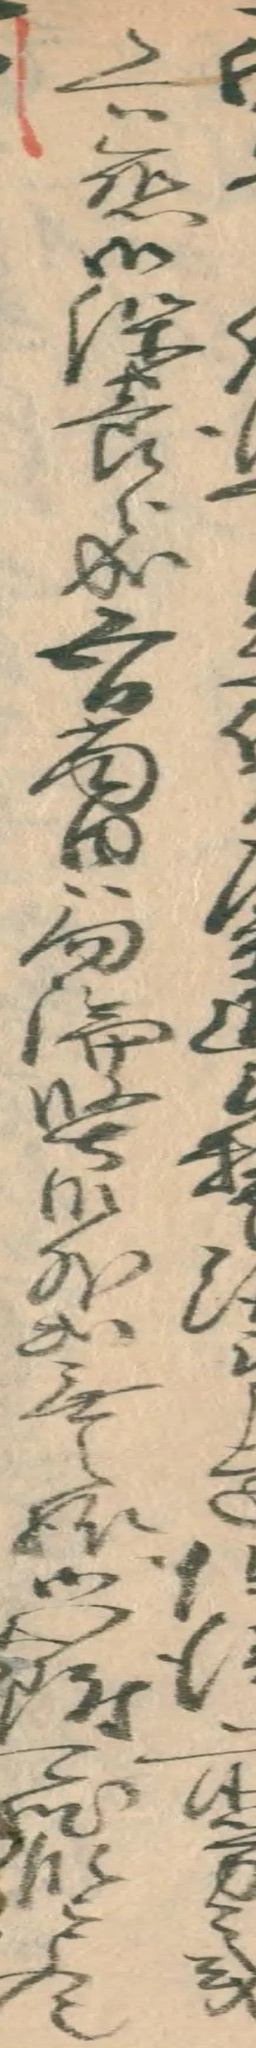候へハ愈御保養被成五日当日ハ勿論堅御外出無之様御心付可然段被申入也
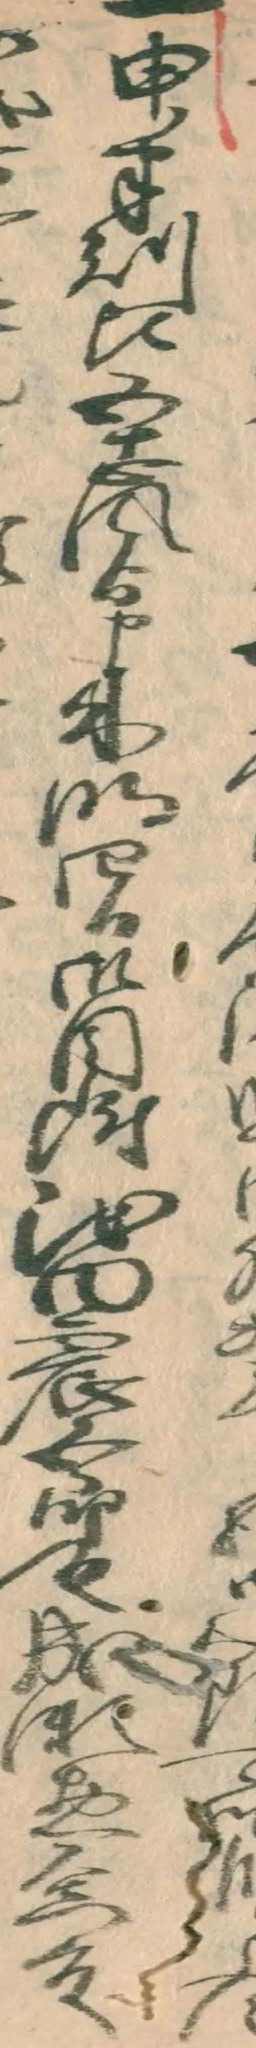一申ノ半刻比五十嵐ゟ申来明四日御目附池田震五郎殿成瀬惣右衛門殿
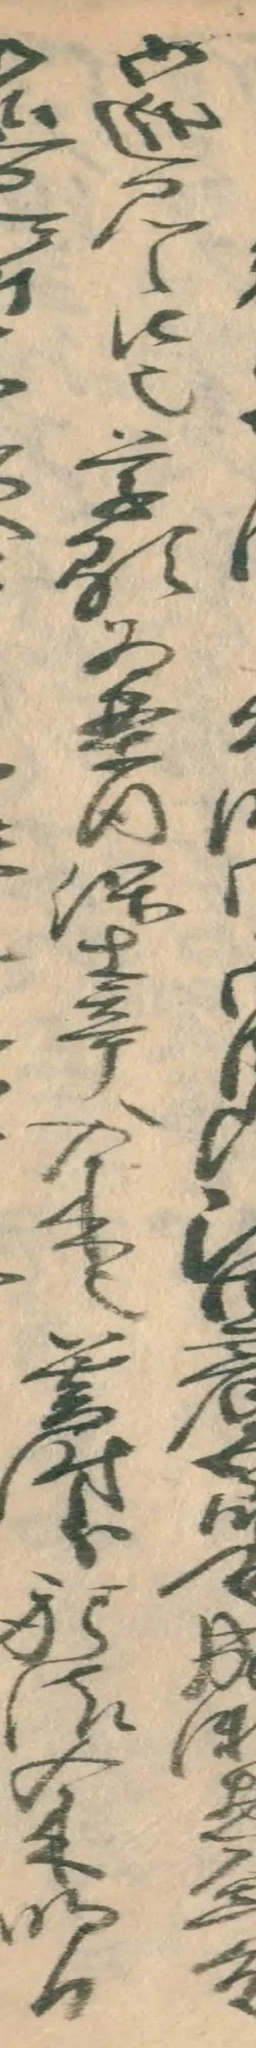御巡見之由也学顕為案内保土亭へ入来也暮時分躬清入来明日
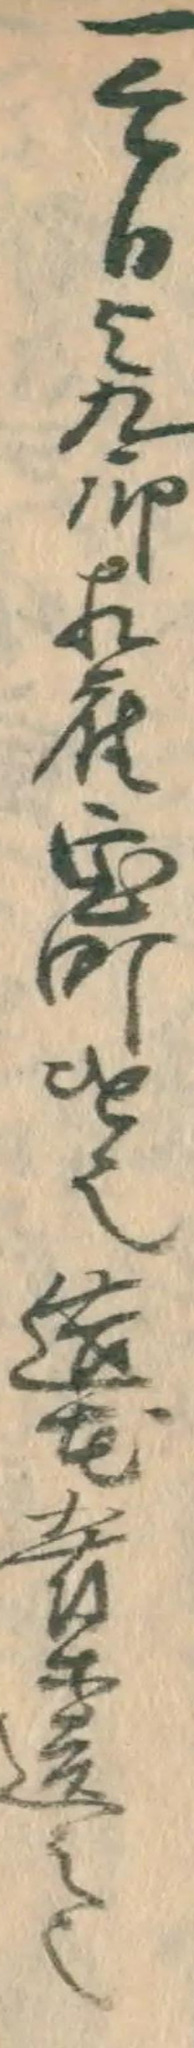一今日与九郎相雇室町遣也造花肴等送之也
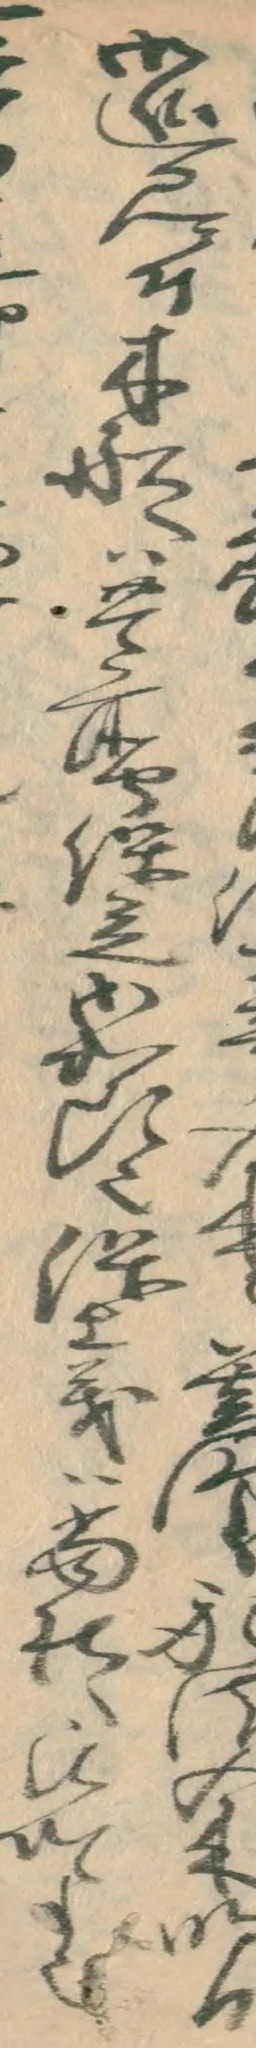御巡見ニ付木船へハ豊前守保覚御出頭也保土義ハ当社へ被出候事也

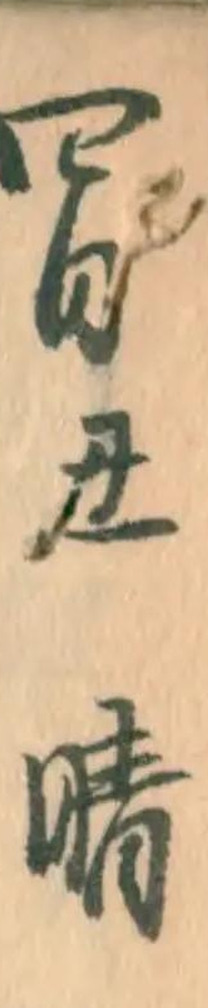四日丑晴
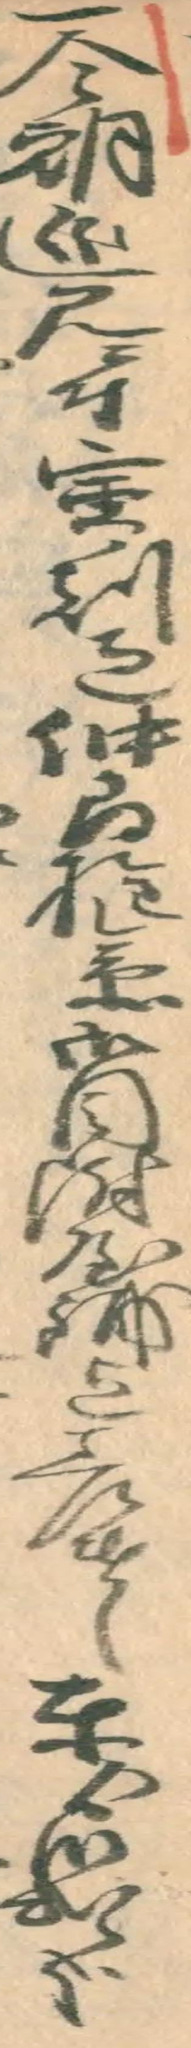一今朝巡見ニ付寅ノ刻過仲間権兵衛御目付屋鋪迄差遣候東ゟ御出候哉
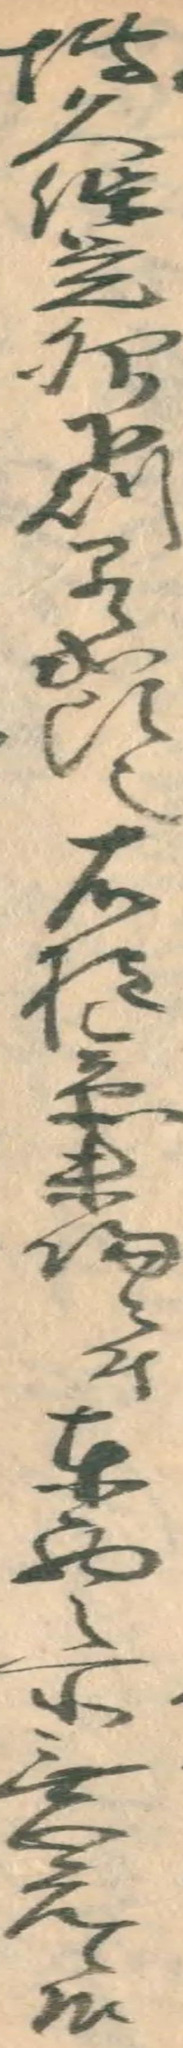博久保覚卯ノ下刻早々出頭也右権兵衛未帰ニ付東西之所無心元候故
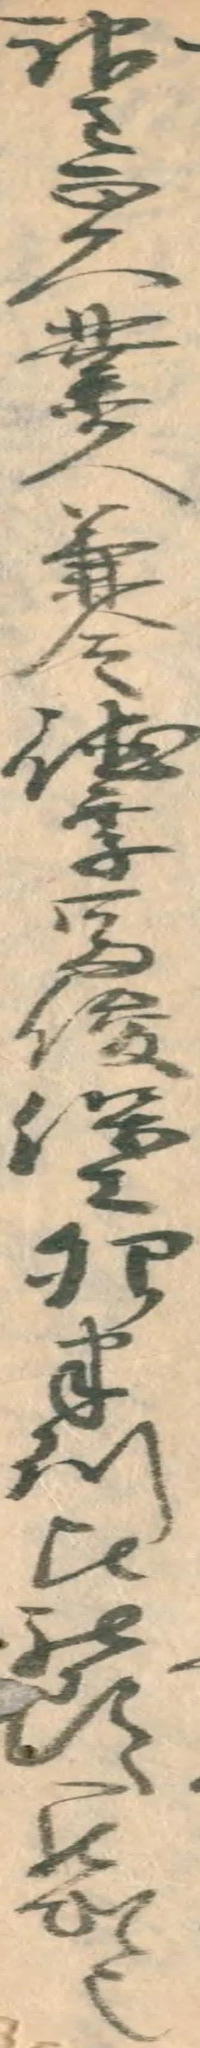神主正久業久兼令徳季富俊保土卯ノ半刻比社頭へ罷出候也
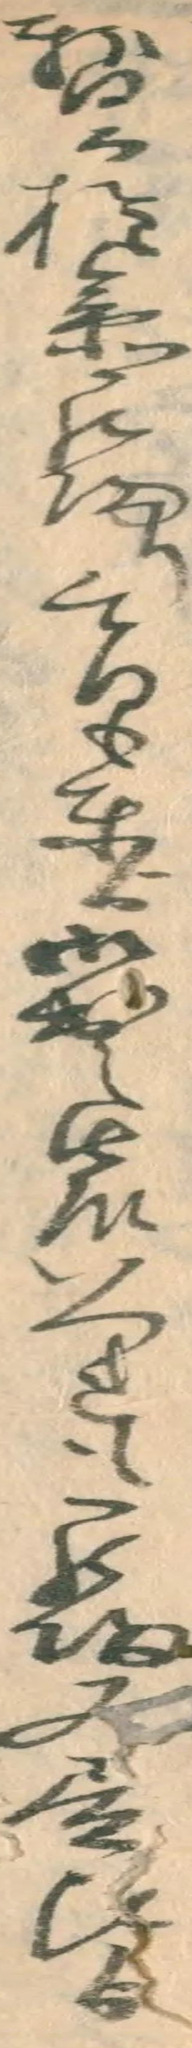暫而権兵衛罷帰り今日も東ゟ御出之由故いつれも罷帰又昼比ゟ
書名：賀茂社記録. 第58冊
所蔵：国立国会図書館 National Diet Library, JAPAN
